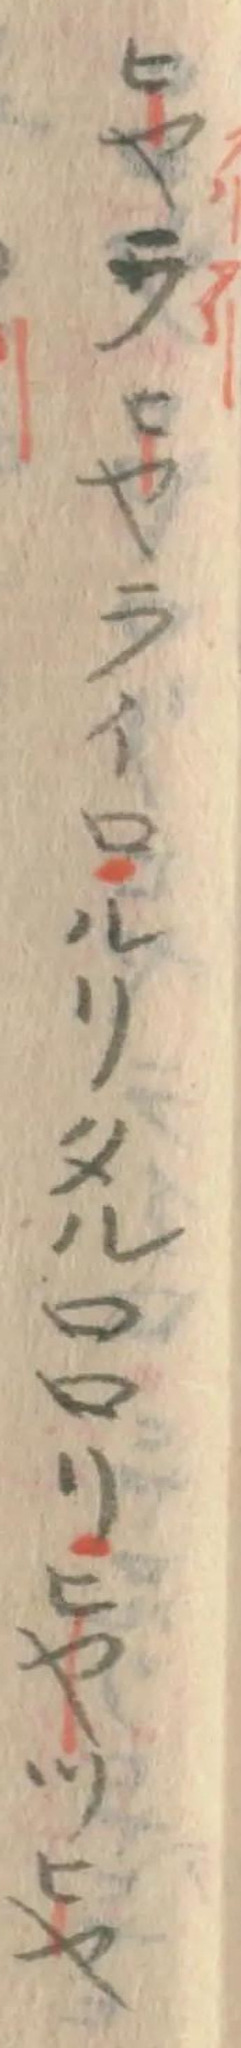ヒ-ヤラヒ-ヤライロ・ルリタルロロリ・ヒ-ヤ-ツヒ-ヤ
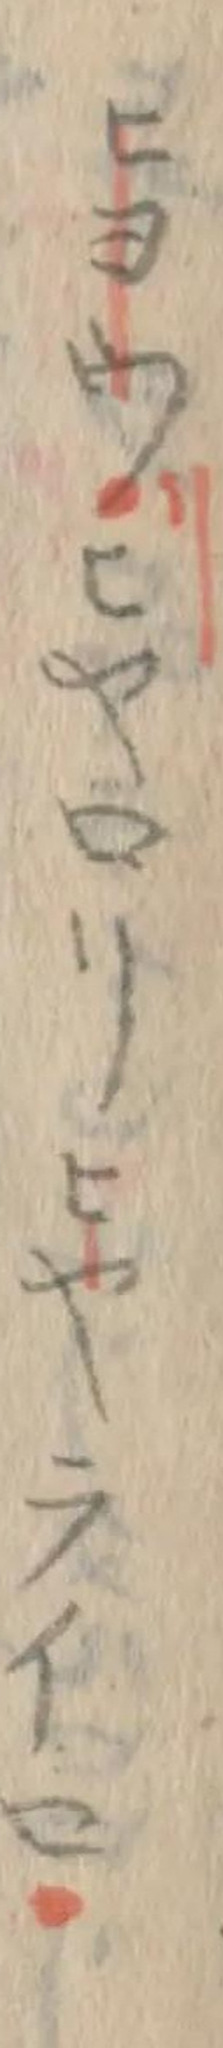ヒ-ヨ-ウヒヤロリヒ-ヤライロ・
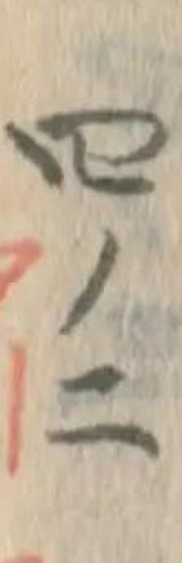四ノ二
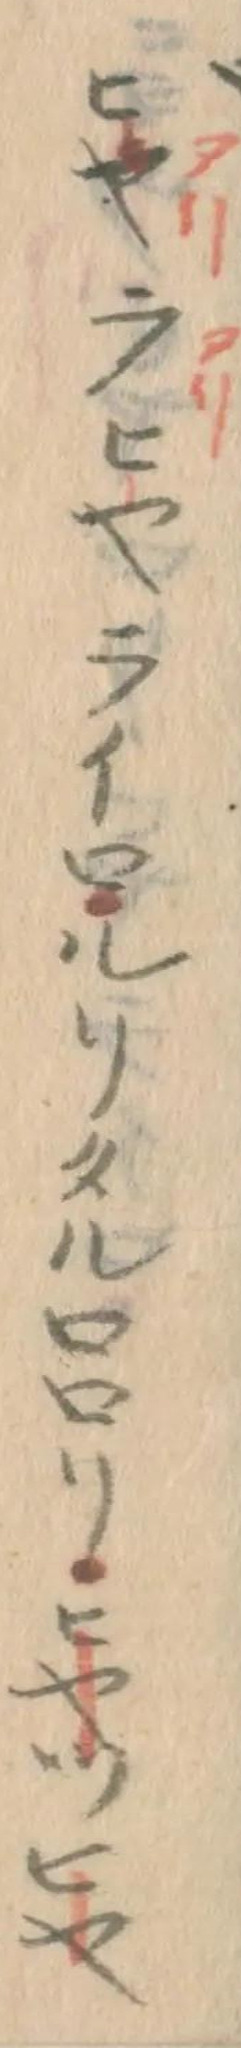ヒ-ヤラヒ-ヤライロ・ルリタルロロリ・ヒ-ヤ-ツヒ-ヤヒ-ヨ

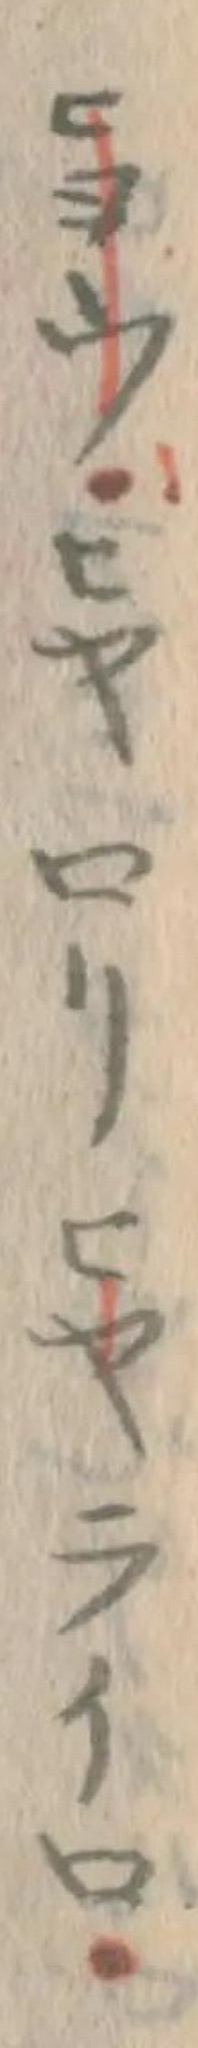ヨ-ウヒヤロリヒ-ヤライロ・
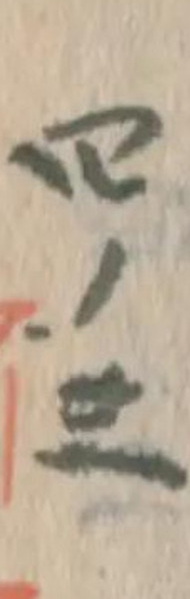四ノ三
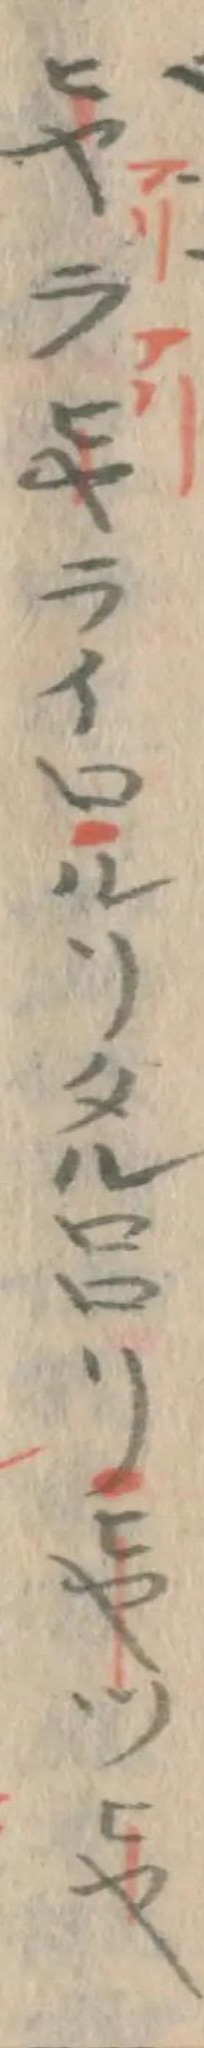ヒ-ヤラヒ-ヤライロ・ルリタルロロリ・ヒ-ヤ-ツヒ-ヤ
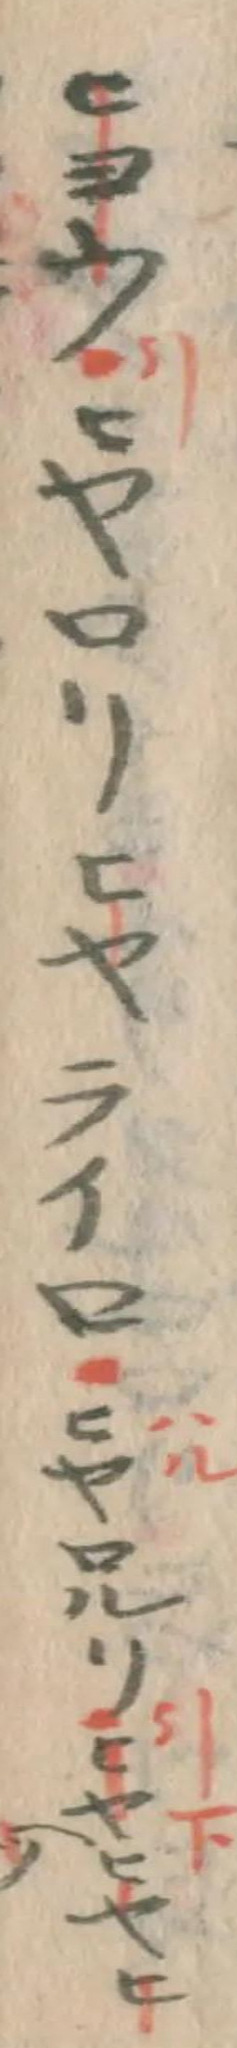ヒ-ヨ-ウ・ヒヤロリヒ-ヤライロ・ヒヤロルリ・ヒ-ヤ-ヒ-ヤヒ-
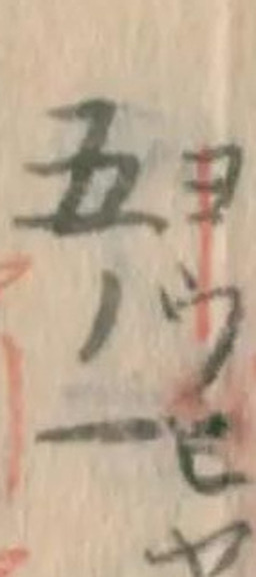五ノ一
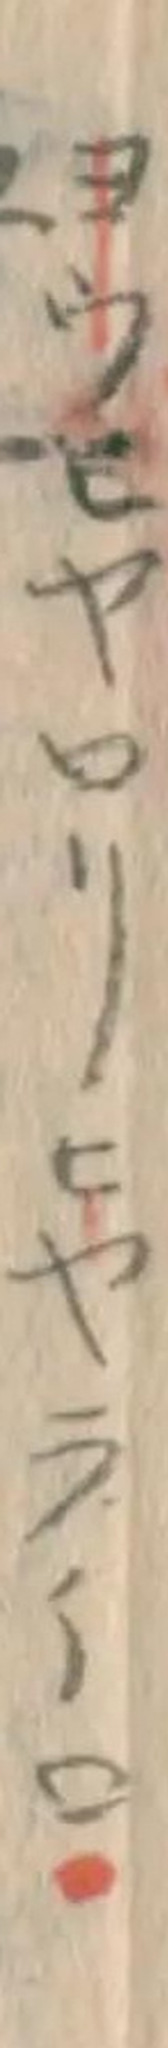ヨ-ウヒヤロリヒ-ヤライロ・
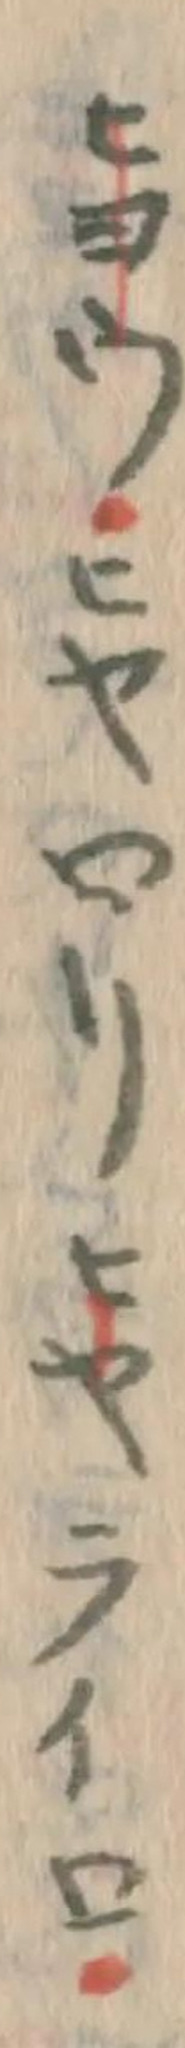ヨ-ウヒヤロリヒ-ヤライロ・
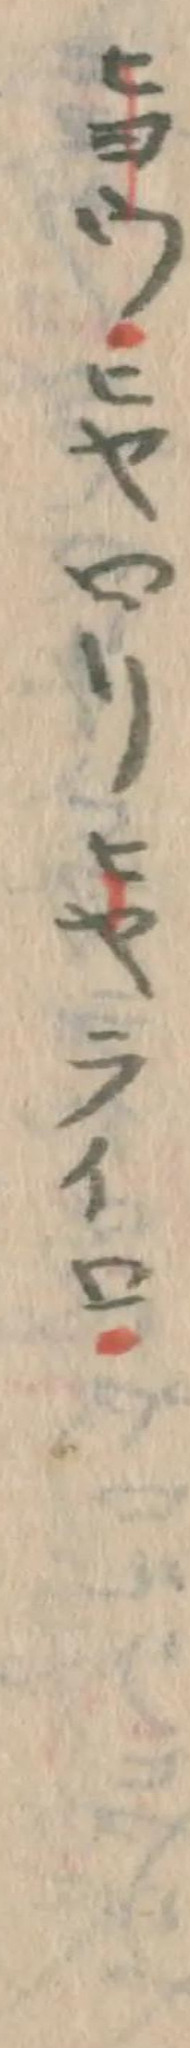ヨ-ウヒヤロリヒ-ヤライロ・
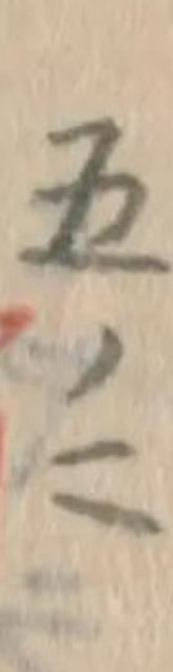五ノ二
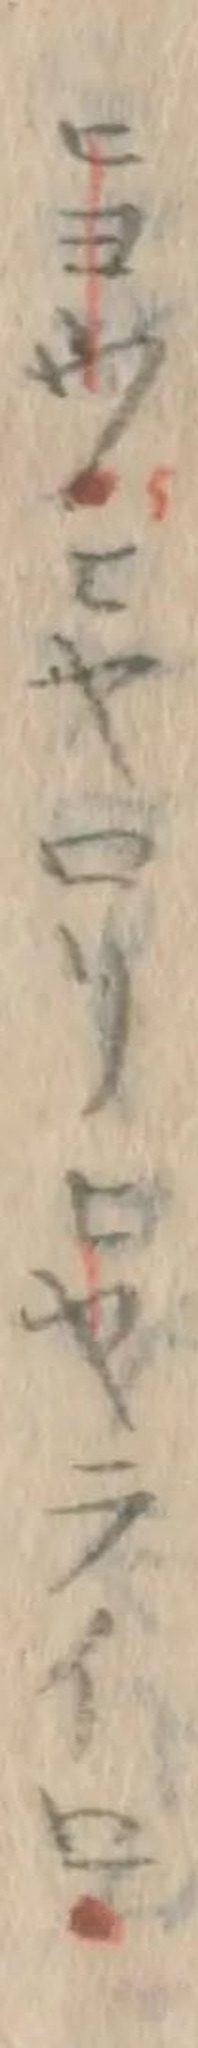ヨ-ウヒヤロリヒ-ヤライロ・
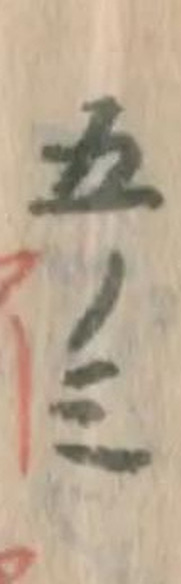五ノ三
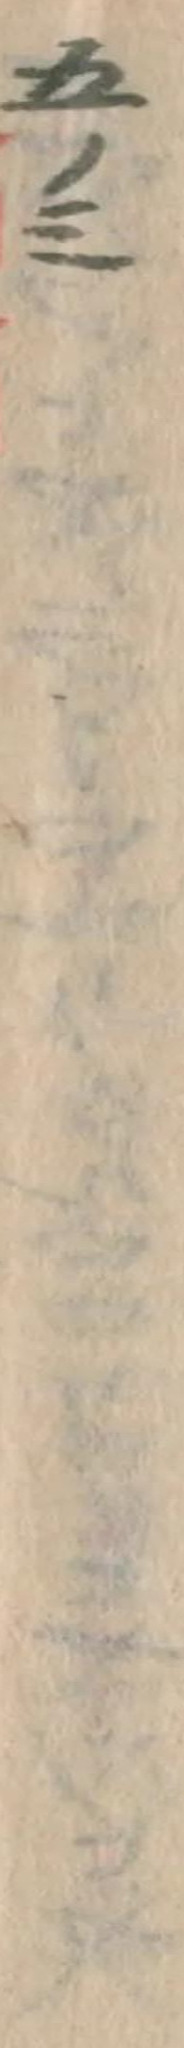五ノ三
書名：賀茂社記録. 第9冊
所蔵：国立国会図書館 National Diet Library, JAPAN
